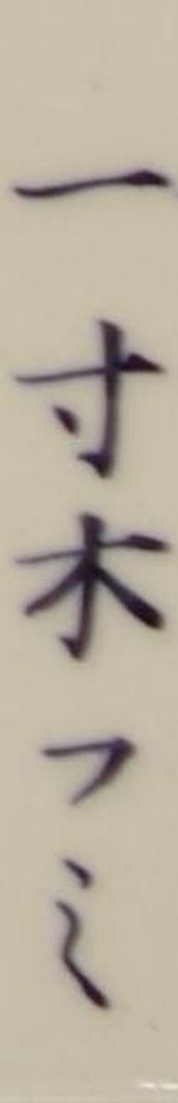一寸木フミ
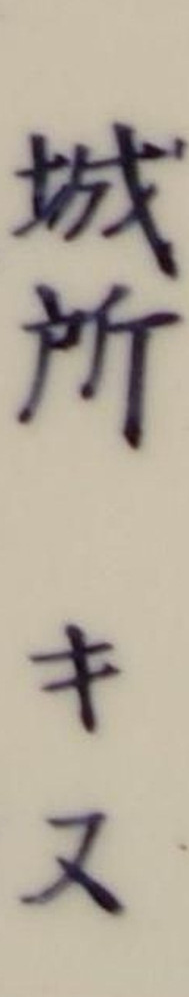城所キヌ
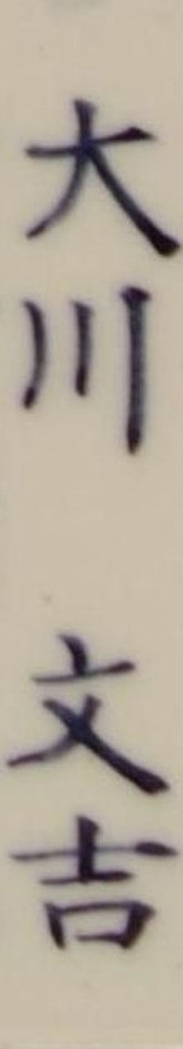大川文吉
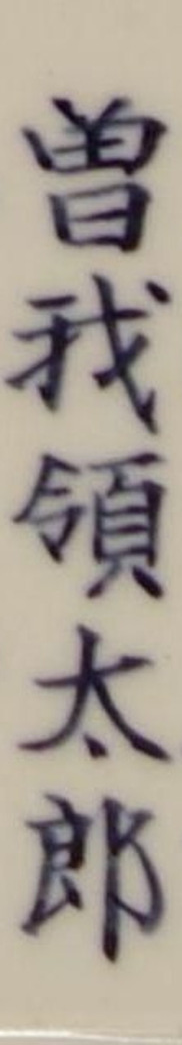曽我領太郎
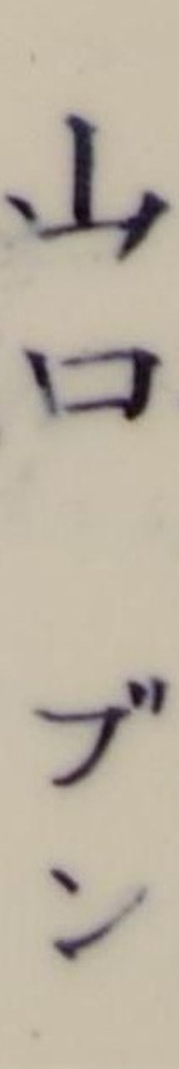山口ブン
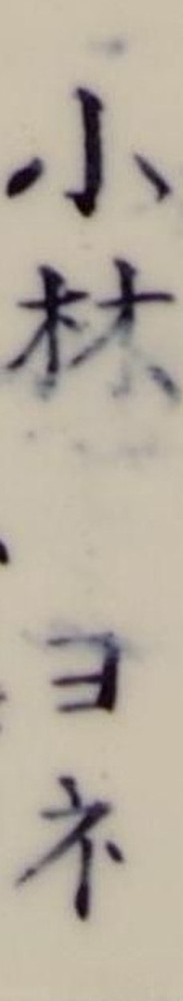小林ヨネ
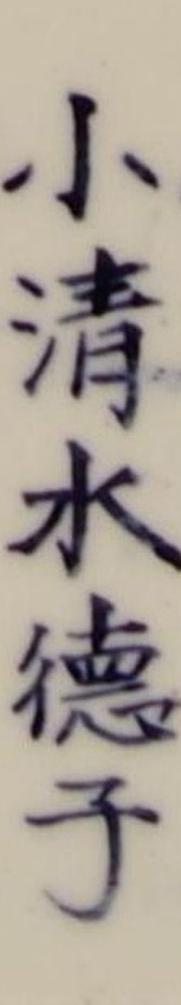小清水徳子
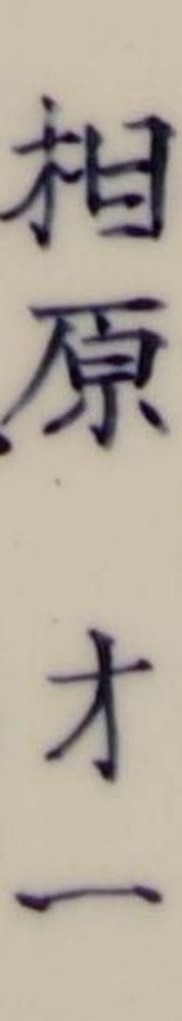相原才一
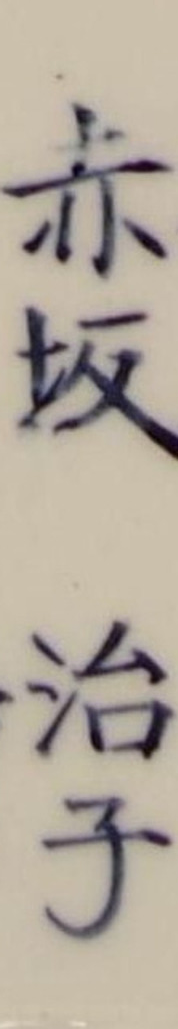赤坂治子
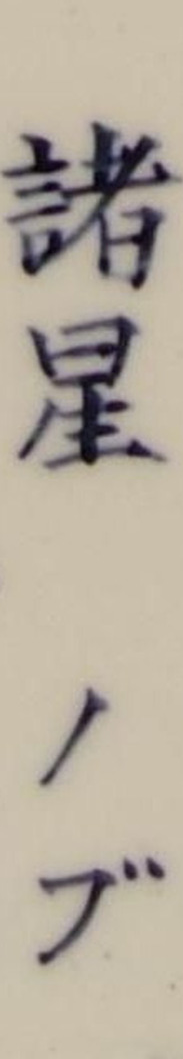諸星ノブ
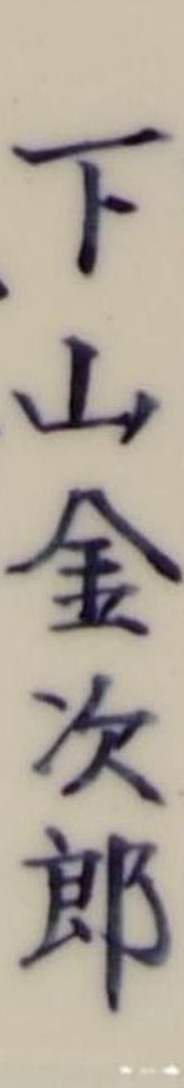下山金次郎
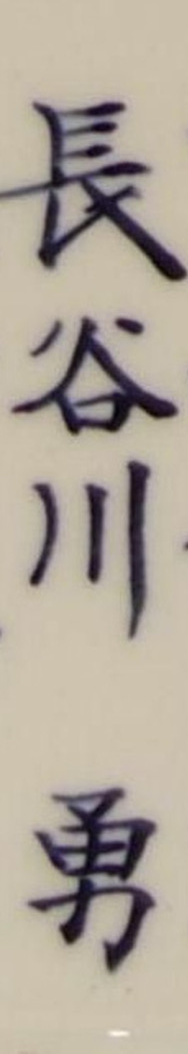長谷川勇
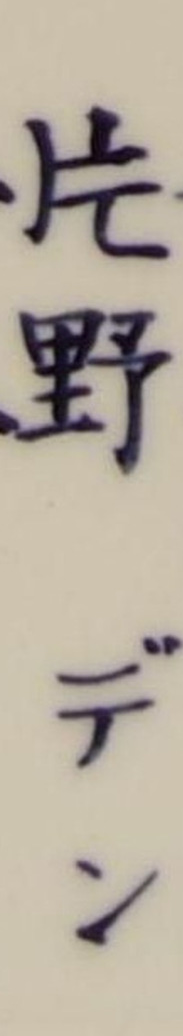片野デン
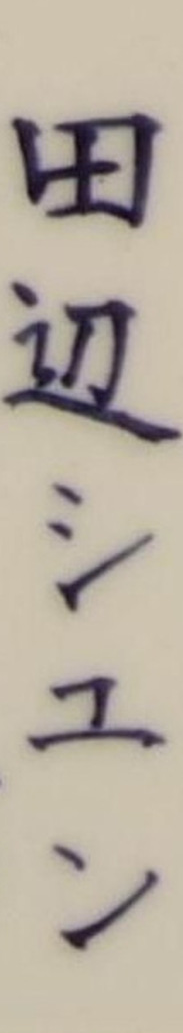田辺シユン
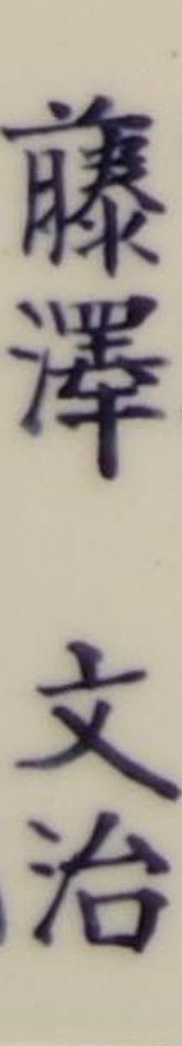藤澤文治
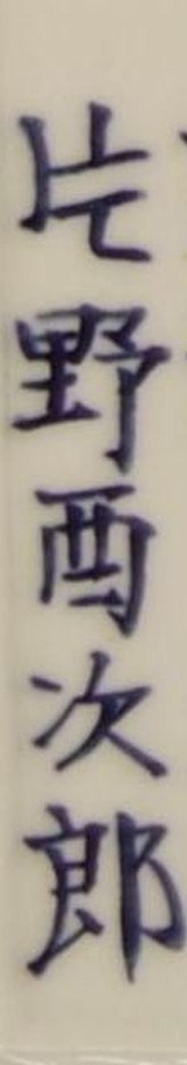片野酉次郎
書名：M~S
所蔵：高野山金剛峯寺
